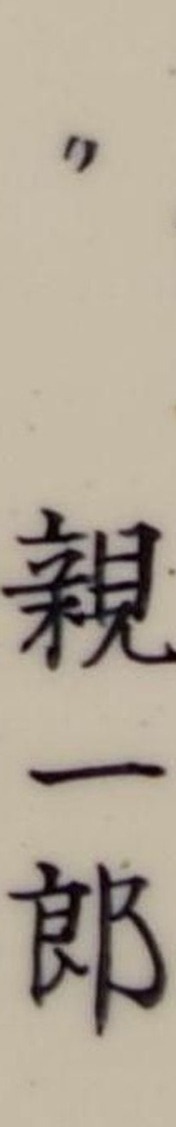親一郎
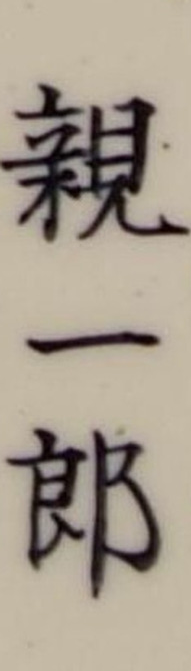親一郎
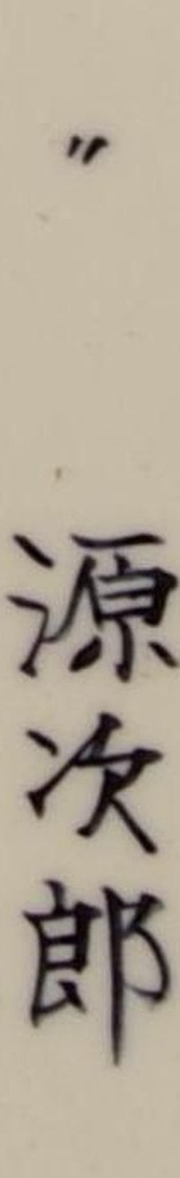源次郎
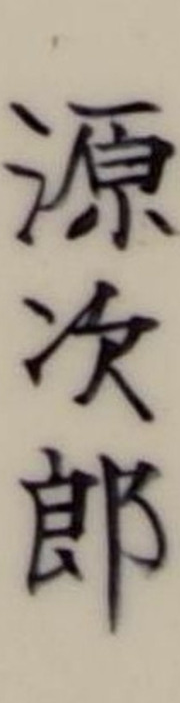源次郎
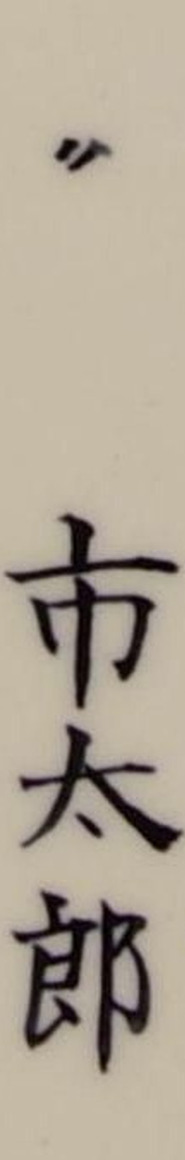市太郎
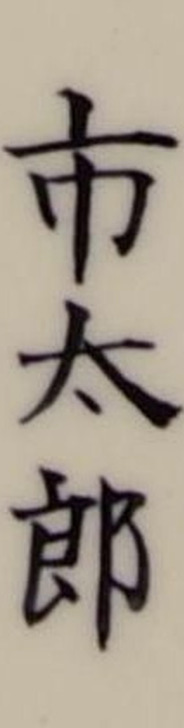市太郎
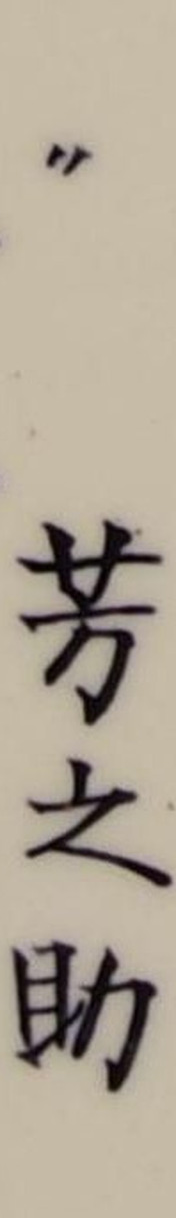芳之助
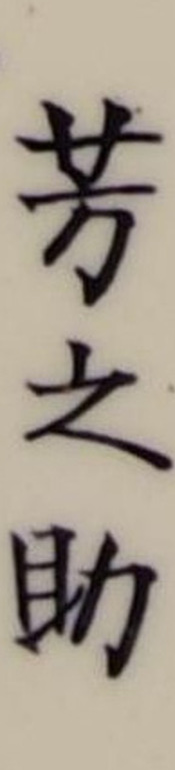芳之助
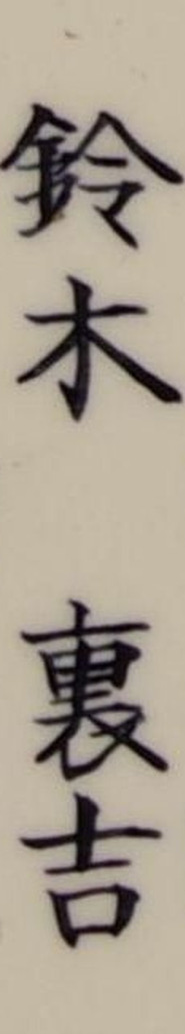鈴木裏吉
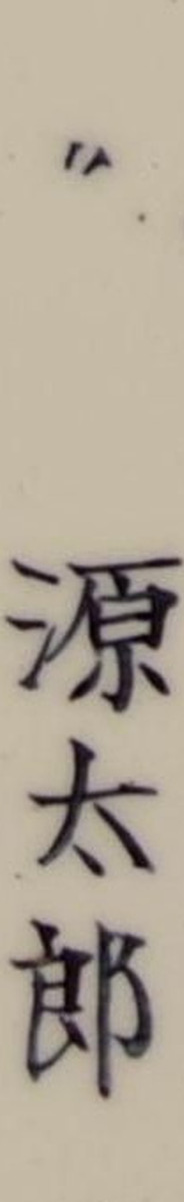源太郎
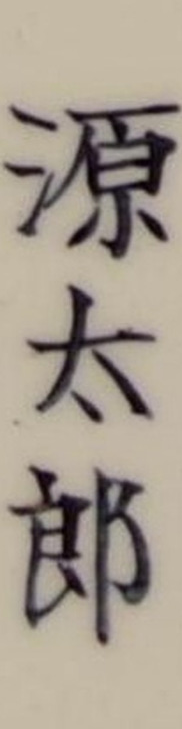源太郎
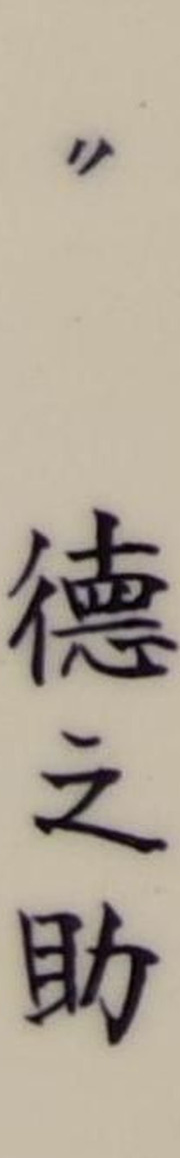徳之助
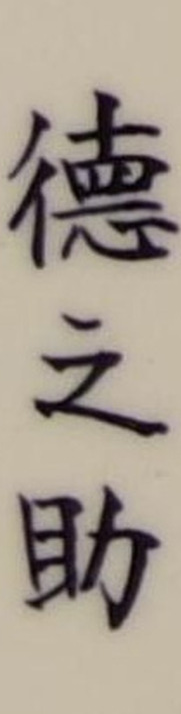徳之助

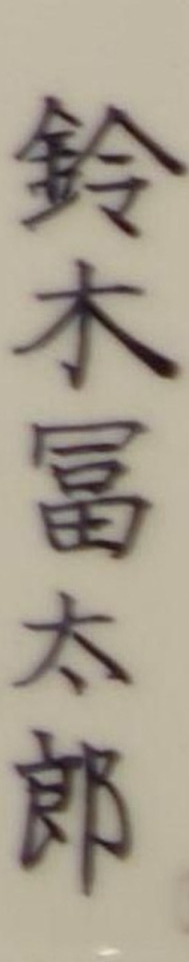鈴木冨太郎
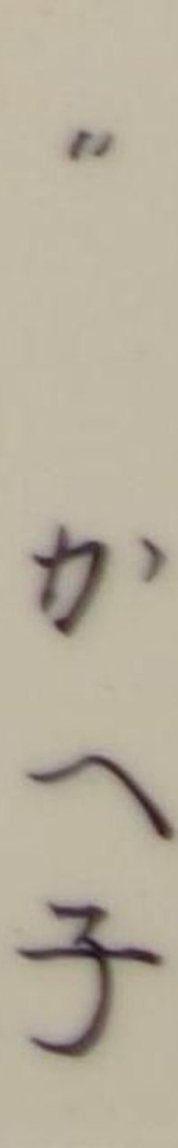かへ子
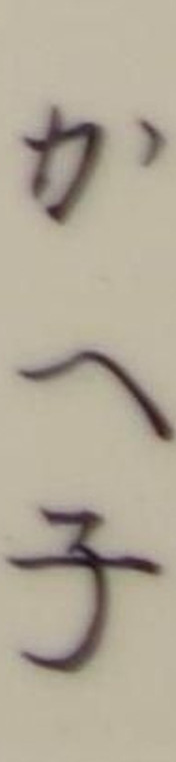かへ子
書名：M~S
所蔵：高野山金剛峯寺
